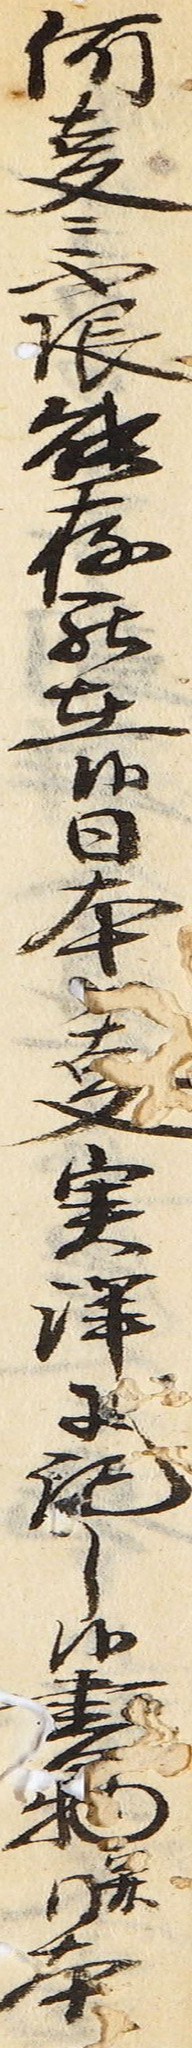何事に不限能存罷在候日本事実詳に記し候書物并日本
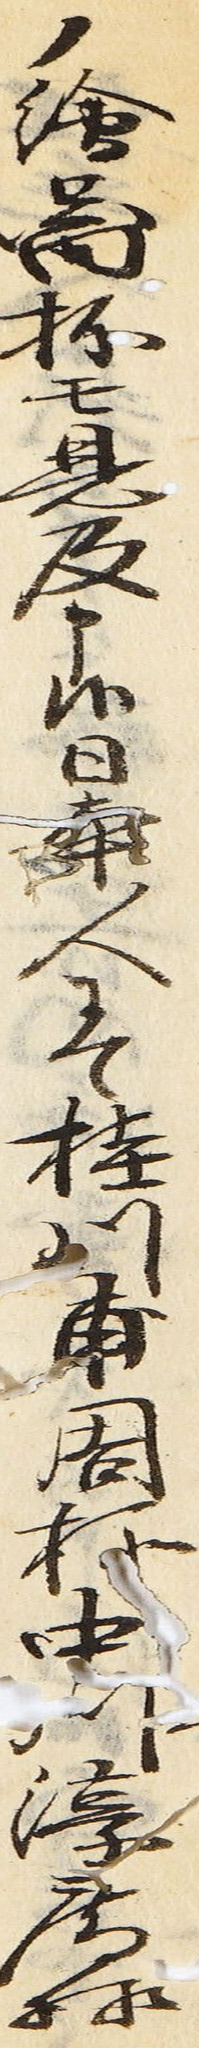の絵図抔も見及申候日本人にて桂川甫周様中川淳庵様
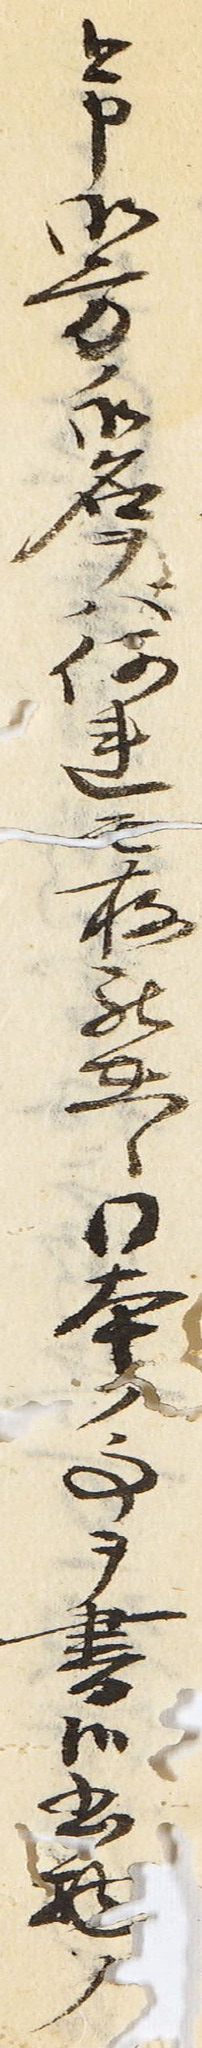と申御方の御名をば何れも存罷在候日本の事を書候書物の
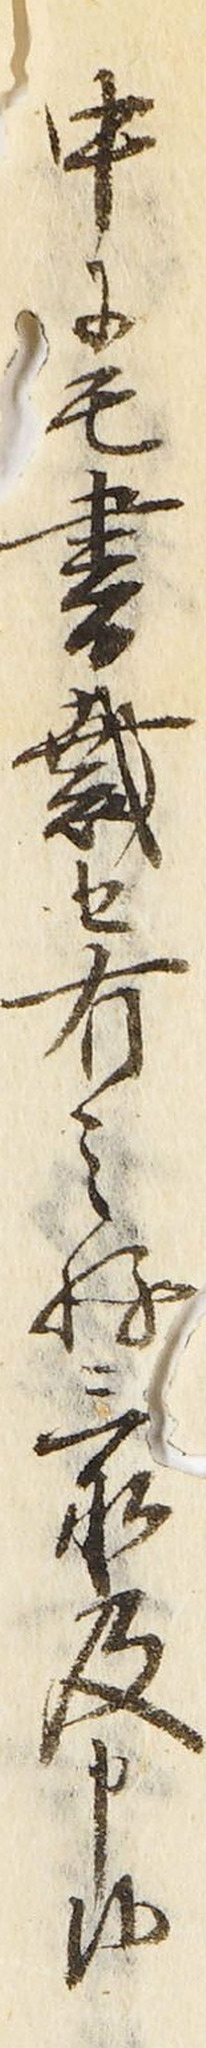中にも書載せ有之様に承及申候
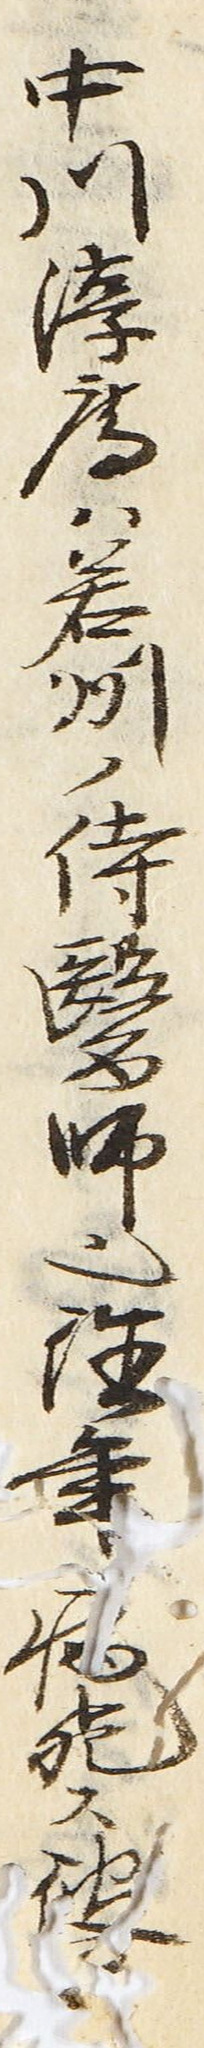中川淳庵は若州の侍医師也往年病死す彼
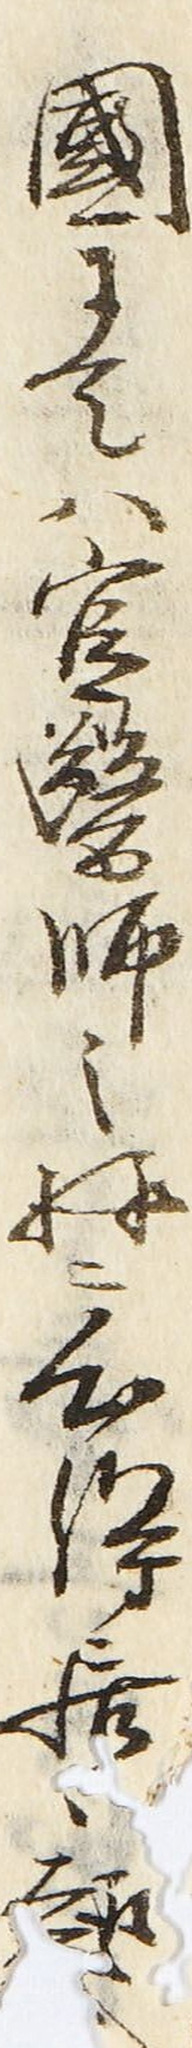国にては官医師之様に心得居候趣也
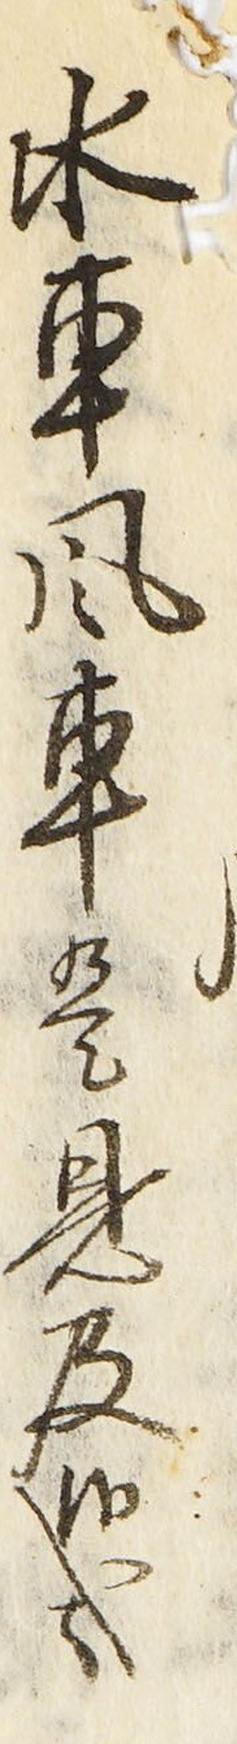水車風車は見及候哉
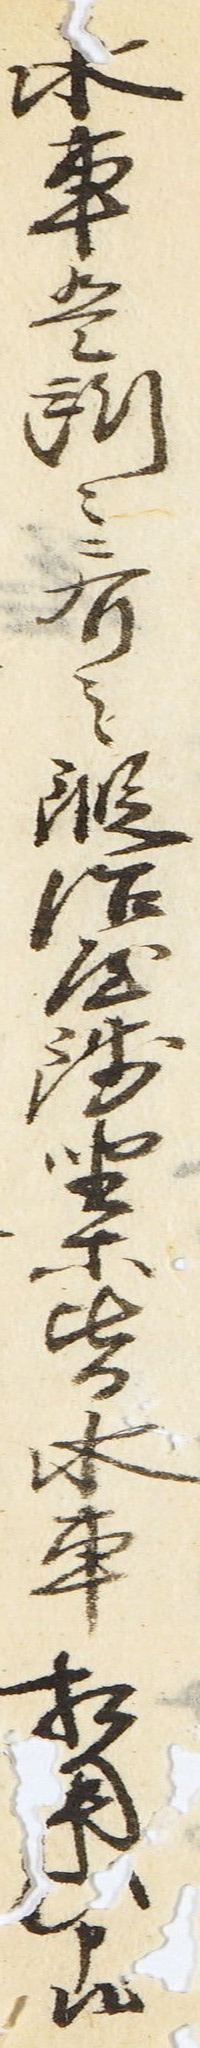水車は所々に有之鍛冶屋銭坐等皆水車相用ひ申候
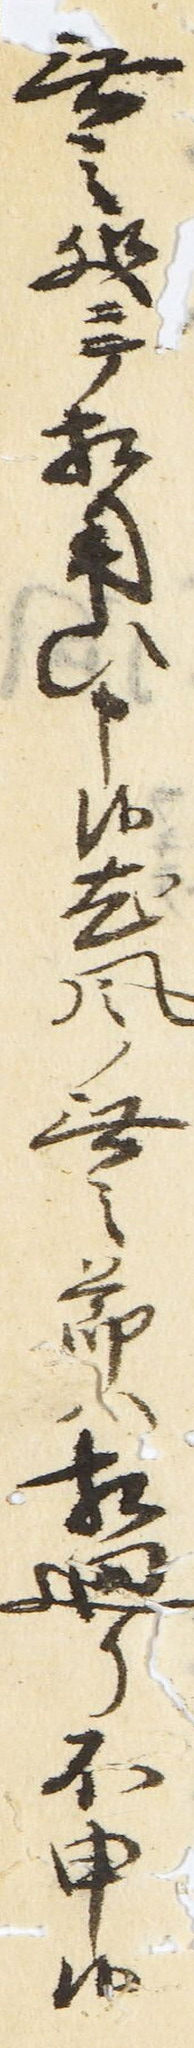無之処にて相用ひ申候尤風の無之節は相廻り不申候

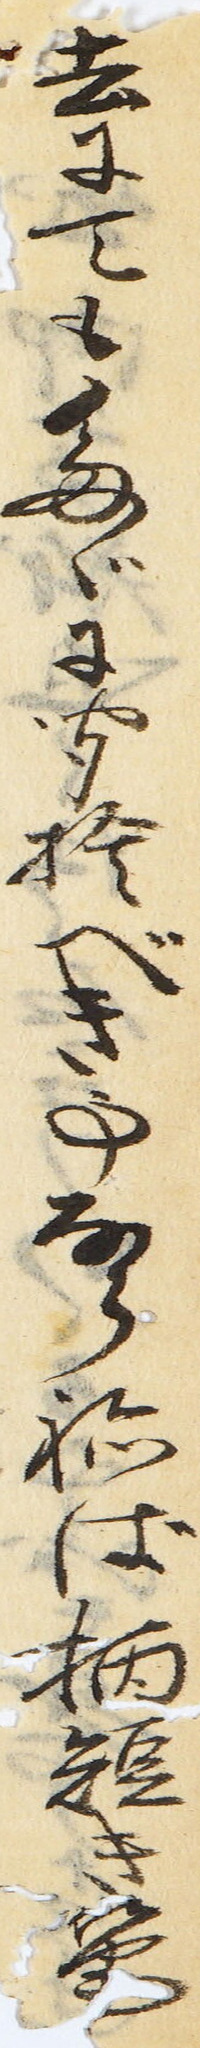去にてもたゞに聞捨べき事ならねば柄短き筆
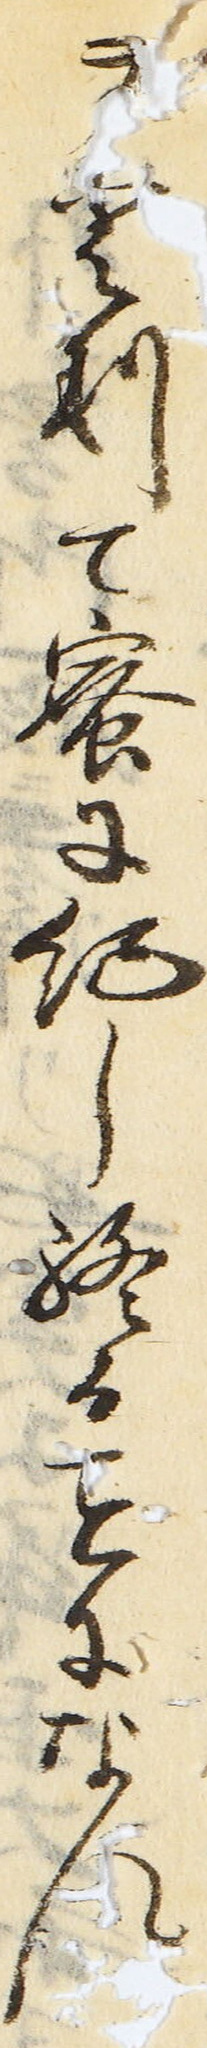をとりて密に記し終ることになん
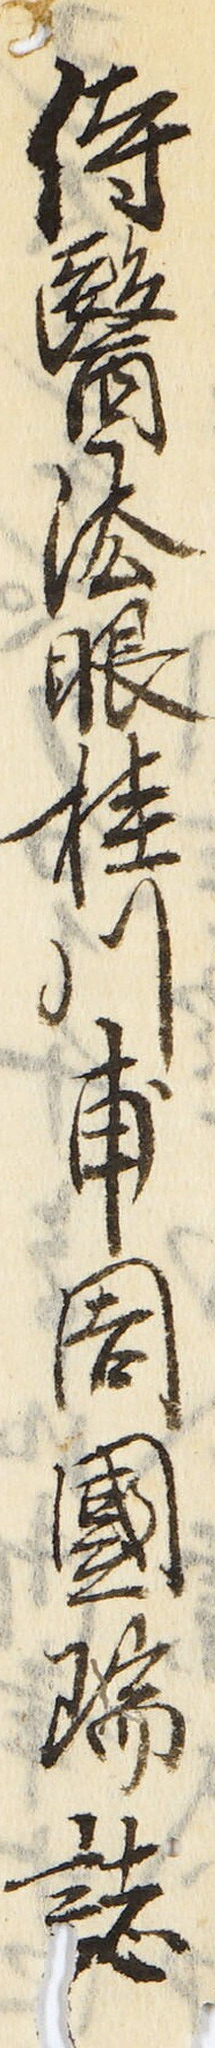侍医法眼桂川甫周国瑞誌
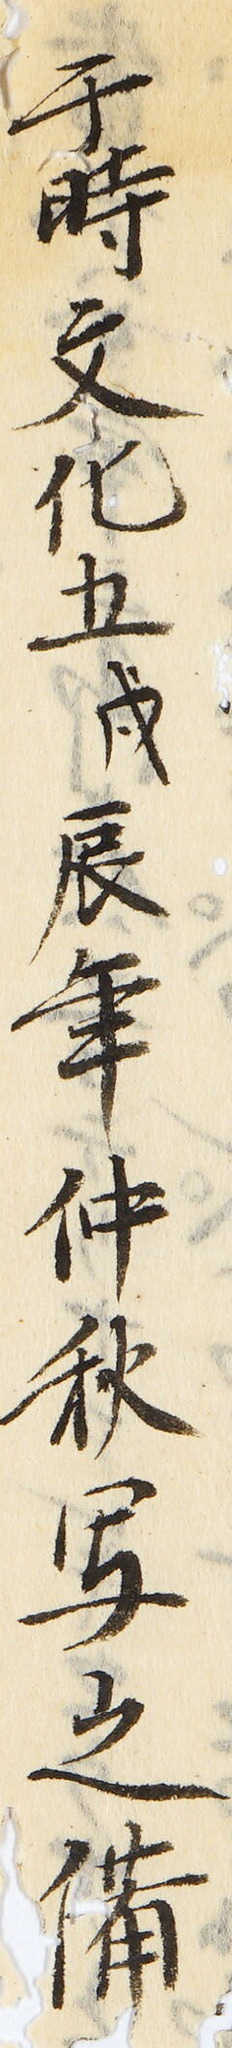于時文化五戊辰年仲秋写之備
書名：神昌丸漂流問答
